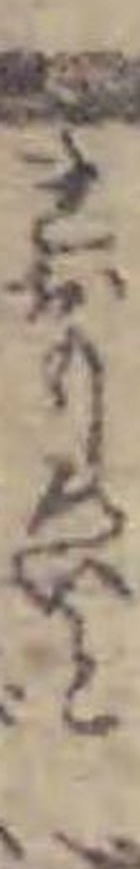れおもしろいと
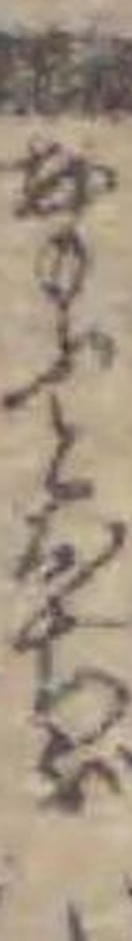おもふとおちぶれ
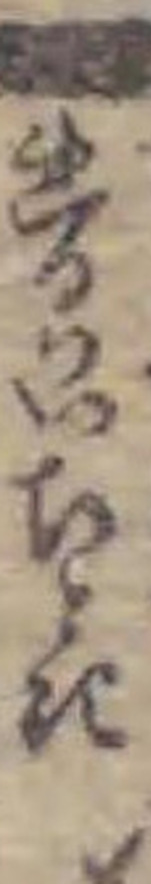るかいちとき
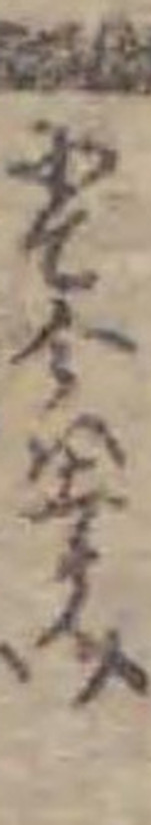にて今は土手ヘ
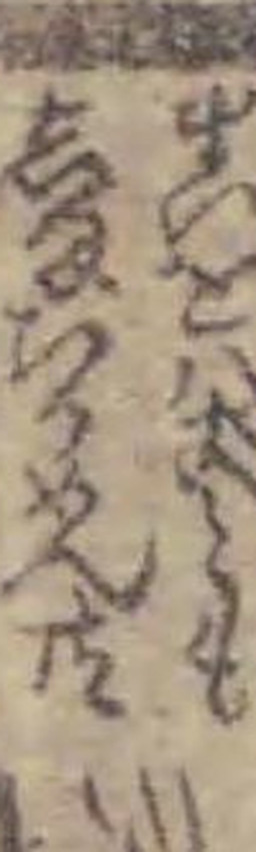しまちりめんとも
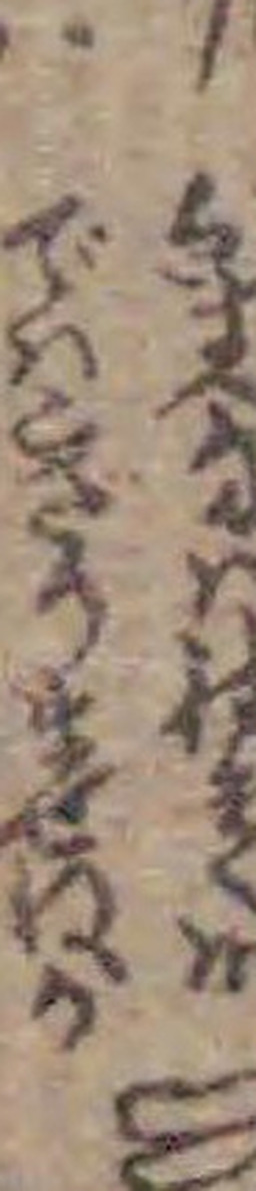ではこざりませぬか
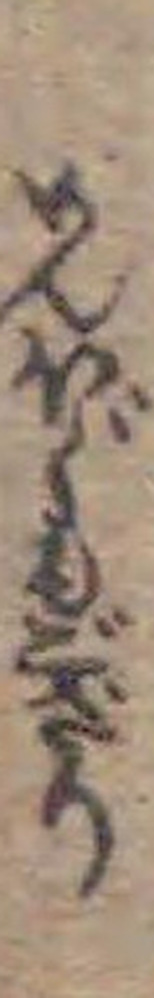めんぼくもござり
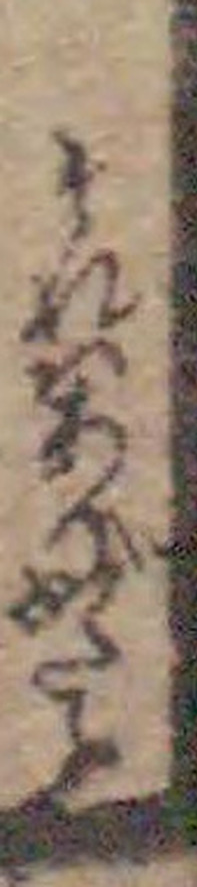それはありがたふ
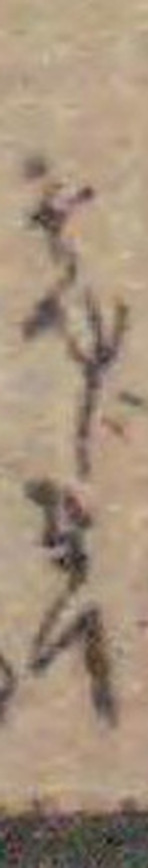そんじます
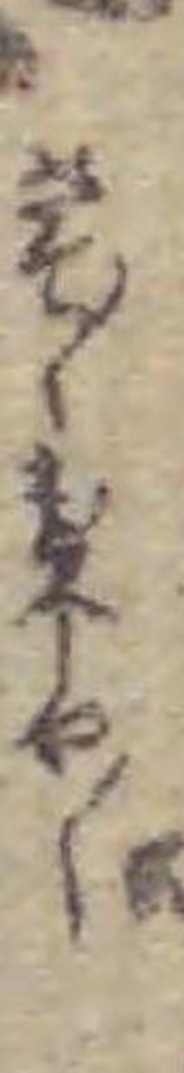さて〳〵も久しや〳〵
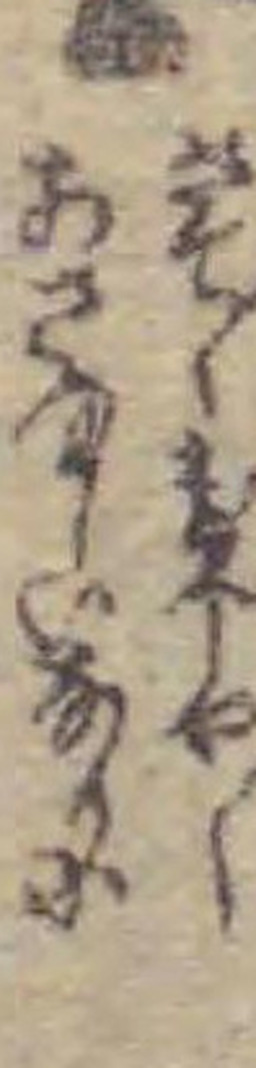あさましいなりに
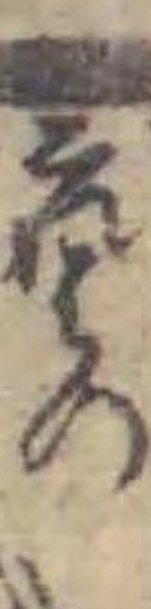こればっ
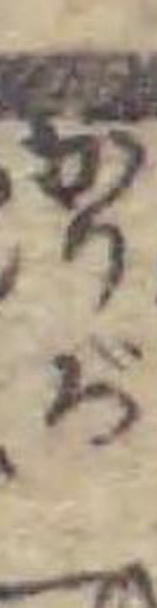かりが
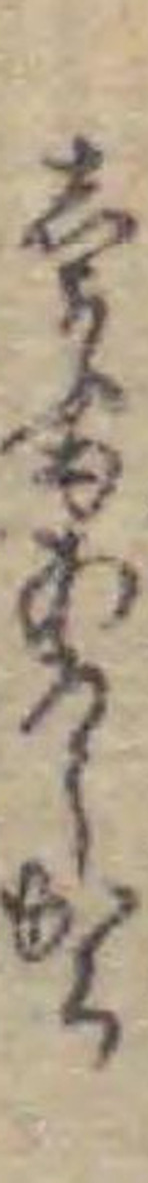しよふもあろうから
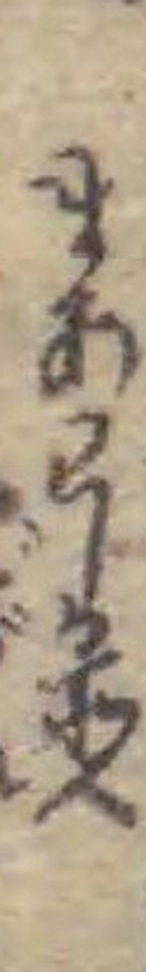まあわしの所へ
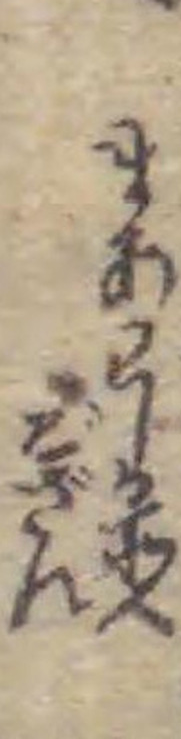まあわしの所へ
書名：通風伊勢物語 : 3巻
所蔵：国立国会図書館 National Diet Library, JAPAN
